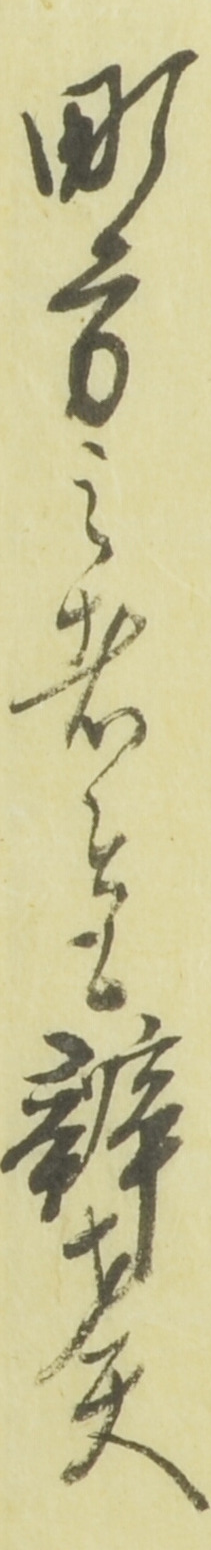町方之者をも弁才天
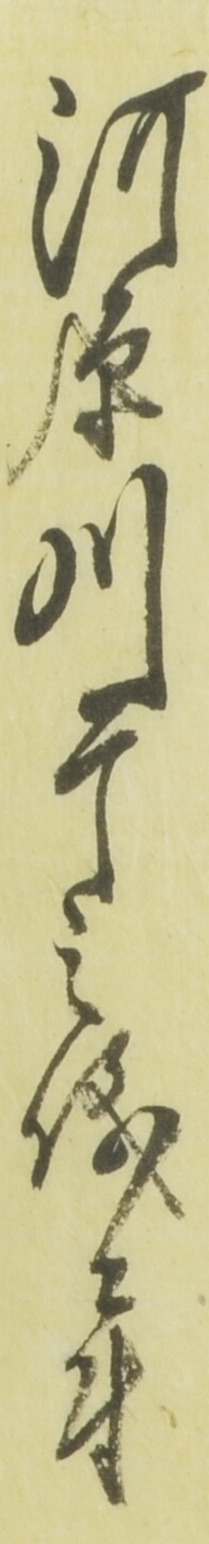河原川干之儀ニ付
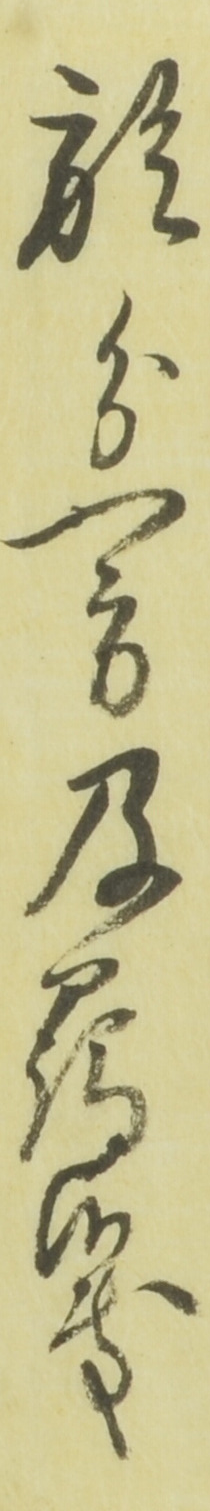於分一方及尋候処
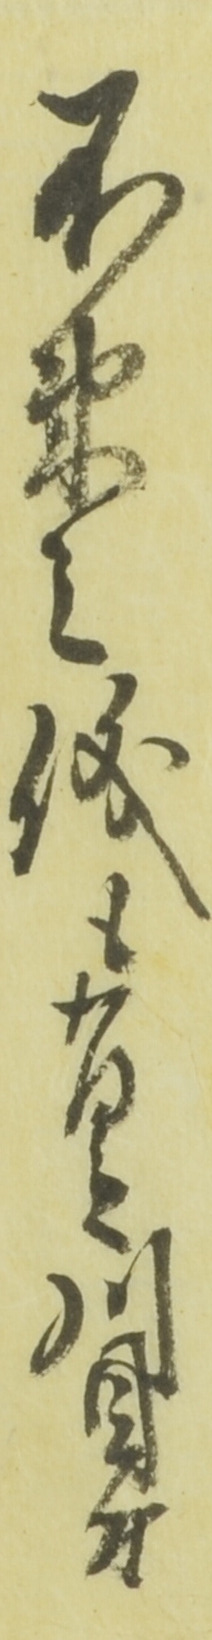不束之儀も有之川目付
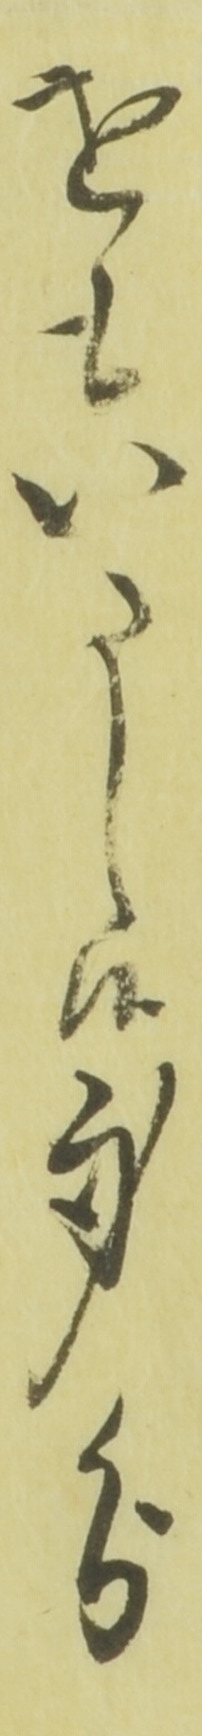をもいたし候身分
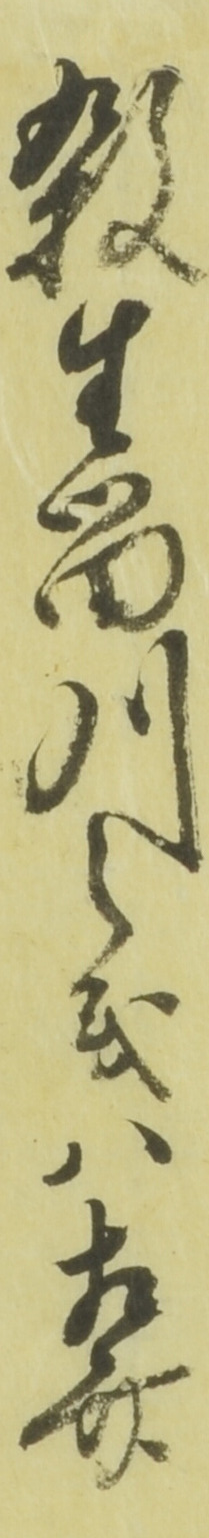殺生留川之義ハ相弁
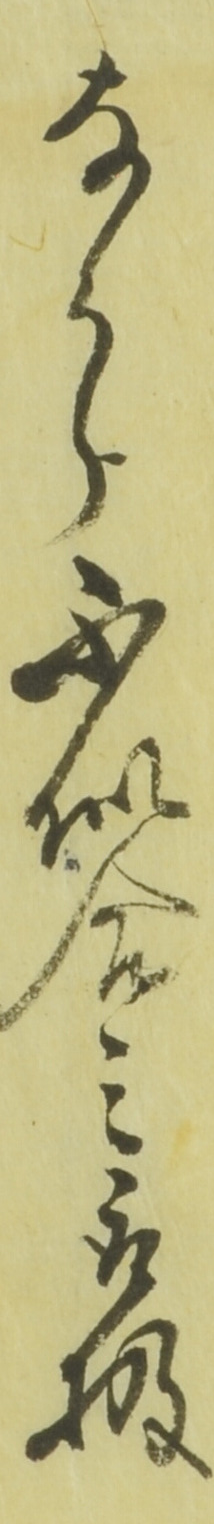なから不似合之取扱
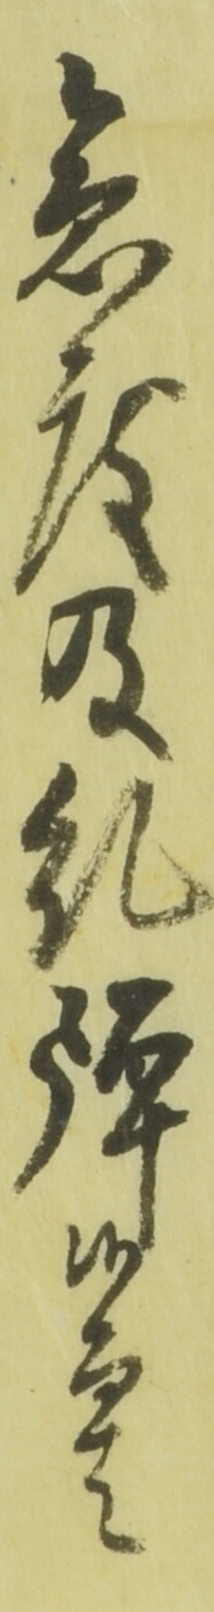急度及糺弾候而は
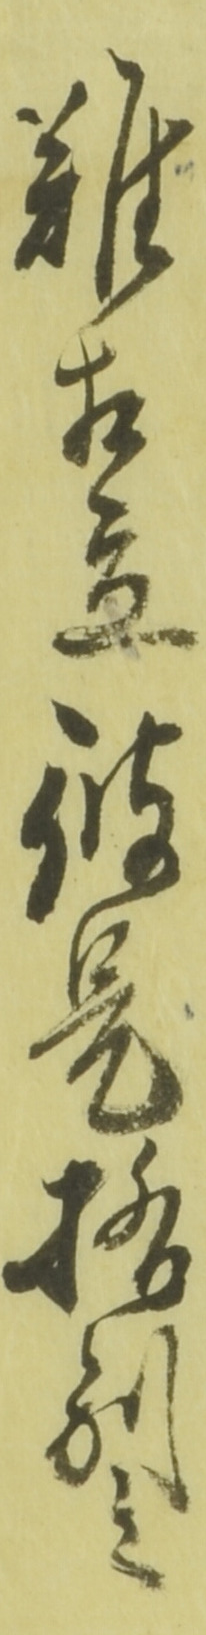難相立彼是格別之
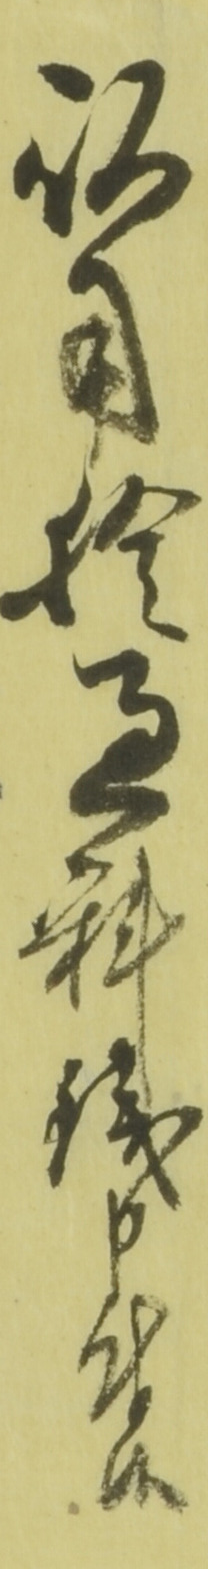以用捨過料銭申付候
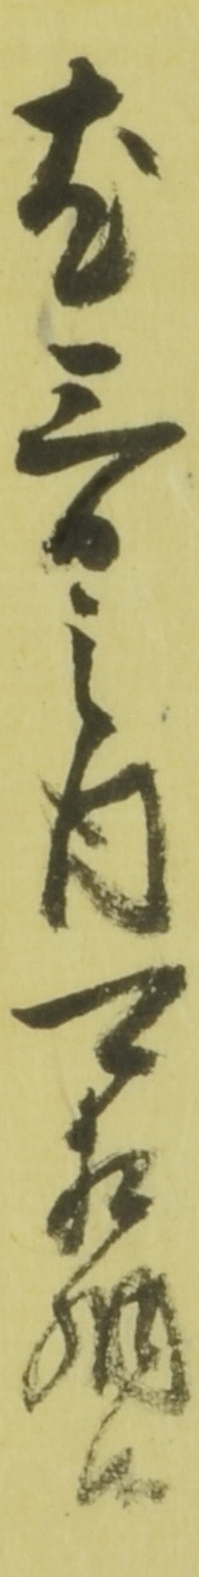尤三日之内可相納候
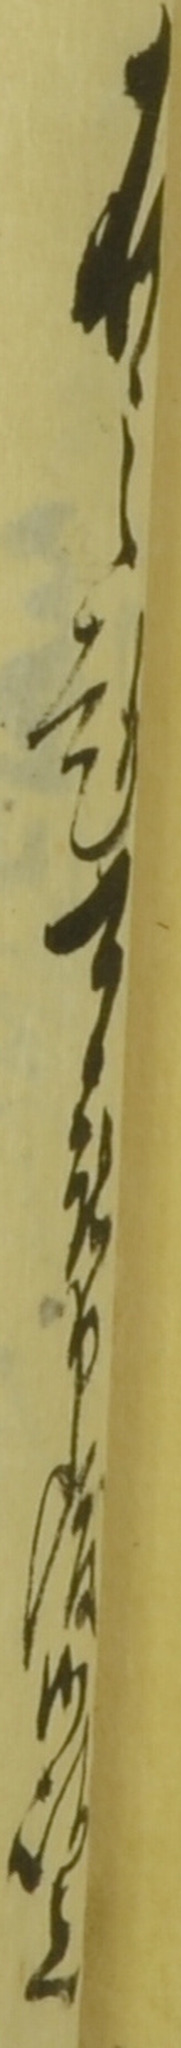右之趣可被申渡候以上
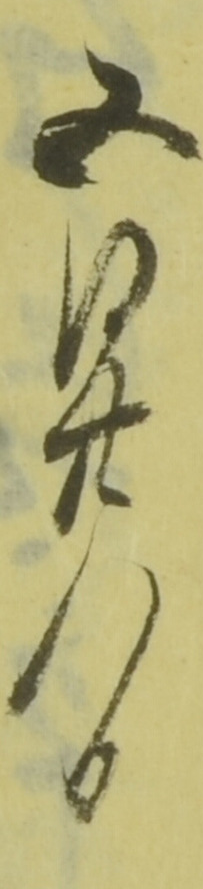五月廿八日
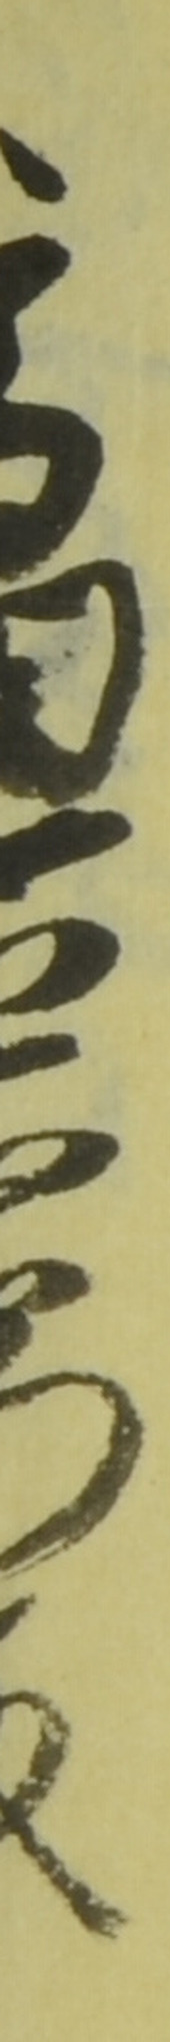高田六右衛門殿

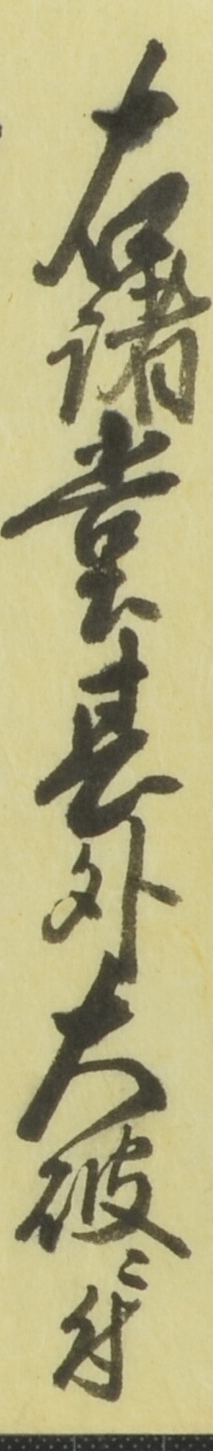右諸堂其外大破ニ付
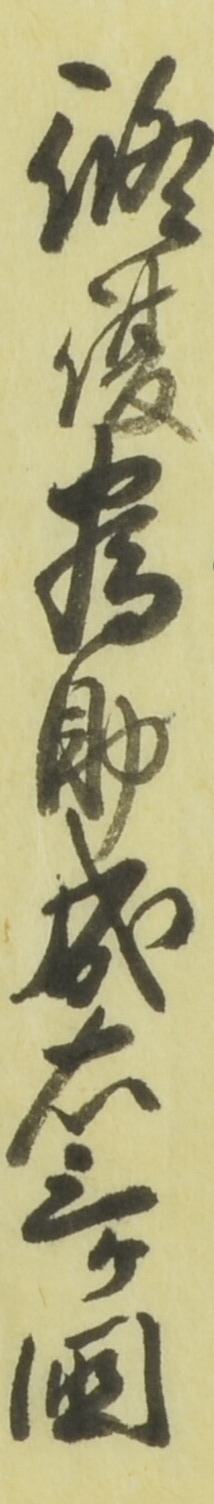修復為助成右三ヶ国
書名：御触書御書附控
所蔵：伊那市立高遠町図書館・合同会社AMANE
